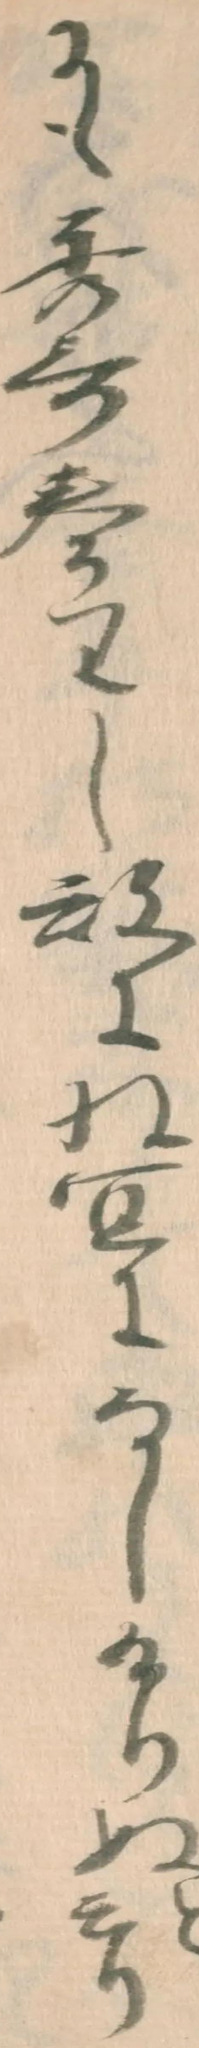にも秀哥奉りし故にね宜になし給りぬと云り
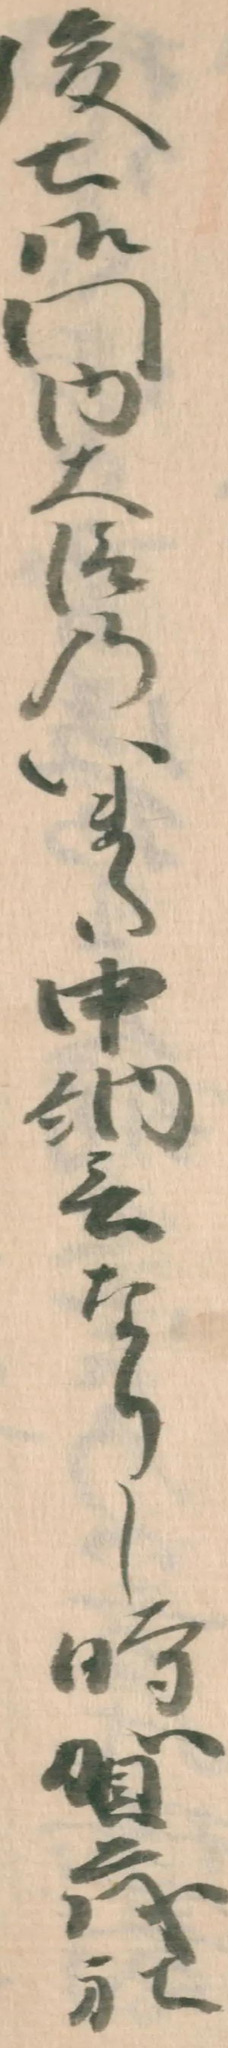後土御門内大臣のいまた中納言なりし時賀茂社
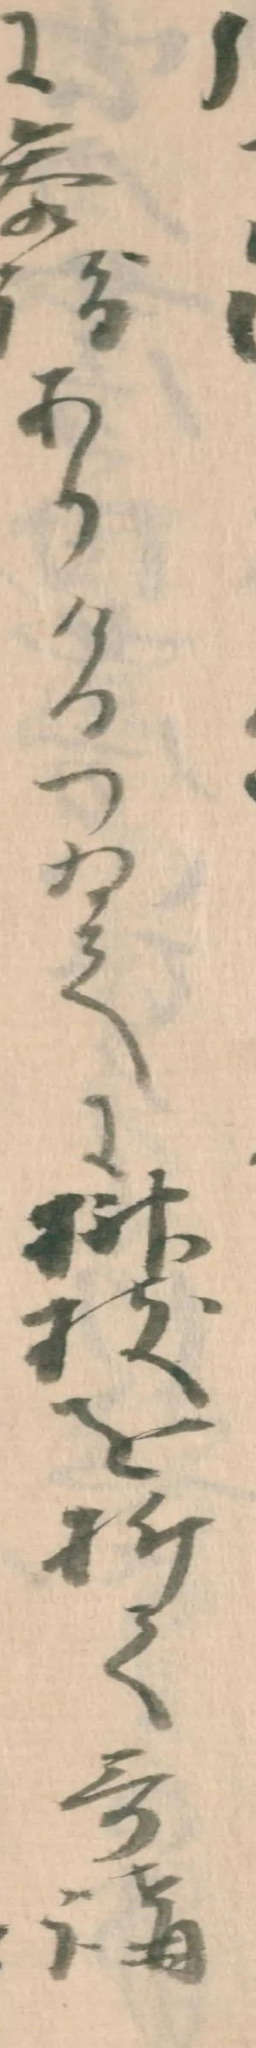に参詣ありけるつゐてに榊枝を折て哥講せられ
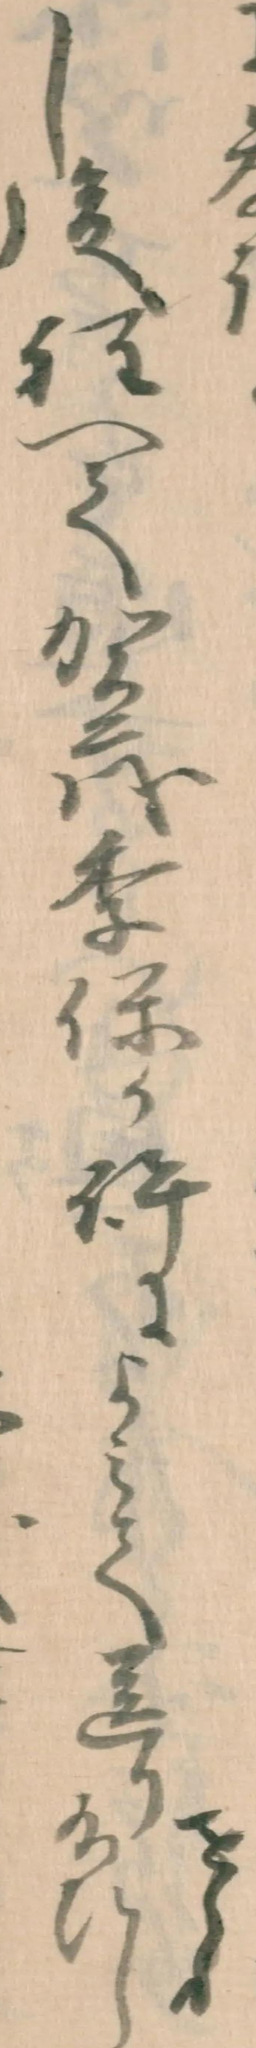し後程へて賀茂季保か許によみて送り給ひし
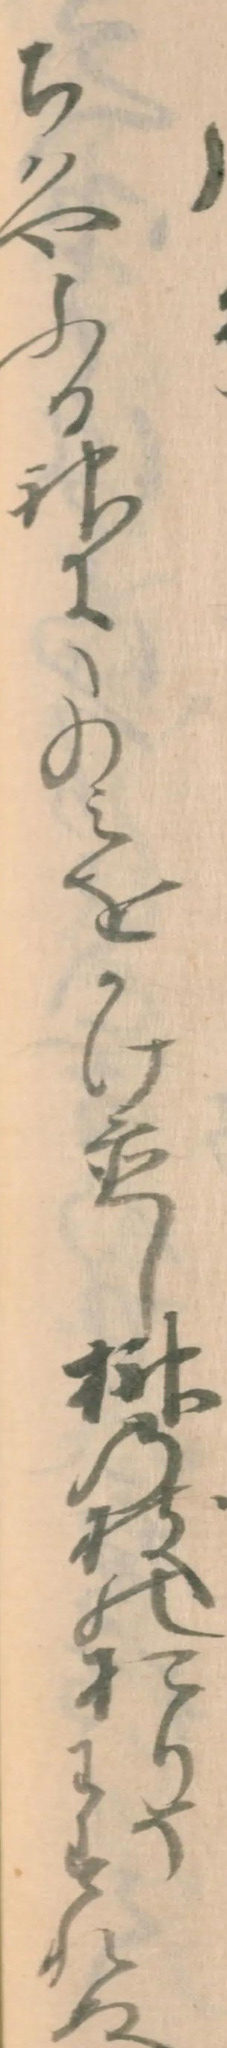ちはやふる神にたのみをかけ置し榊の枝のおりそわすれぬ
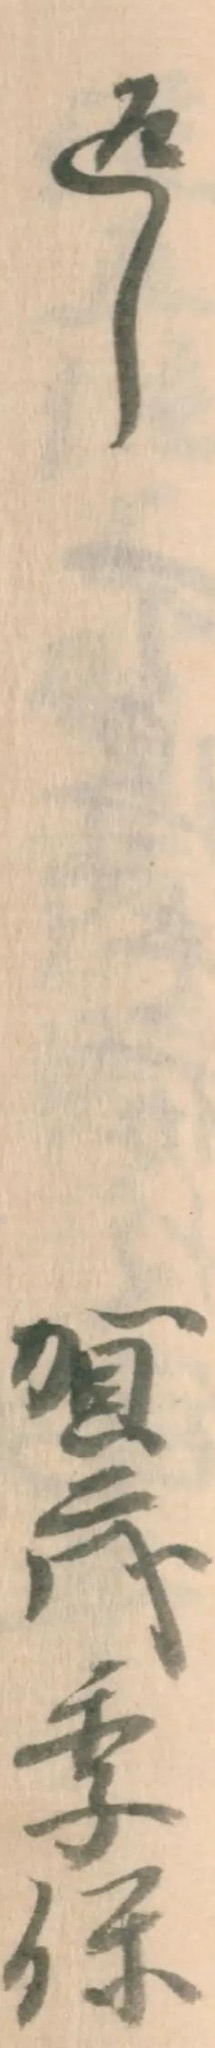返し賀茂季保
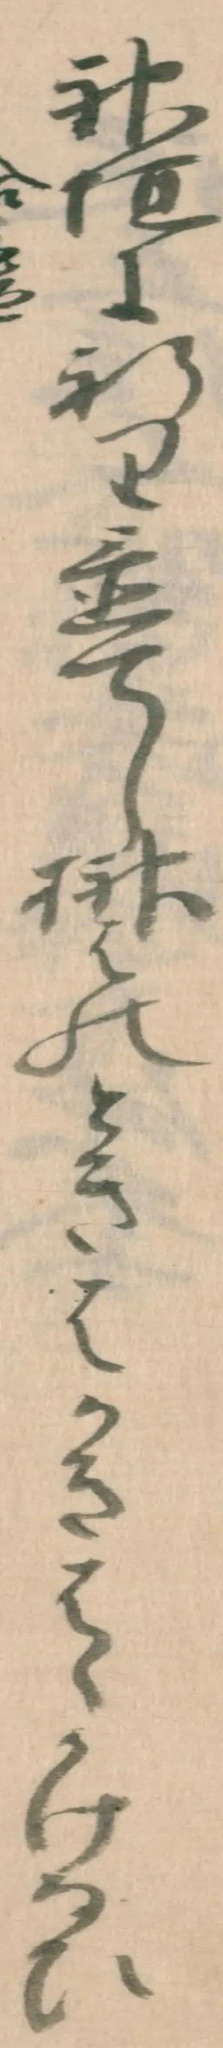神垣に祈り置てし榊はのときはかきはゝかけなひくまて
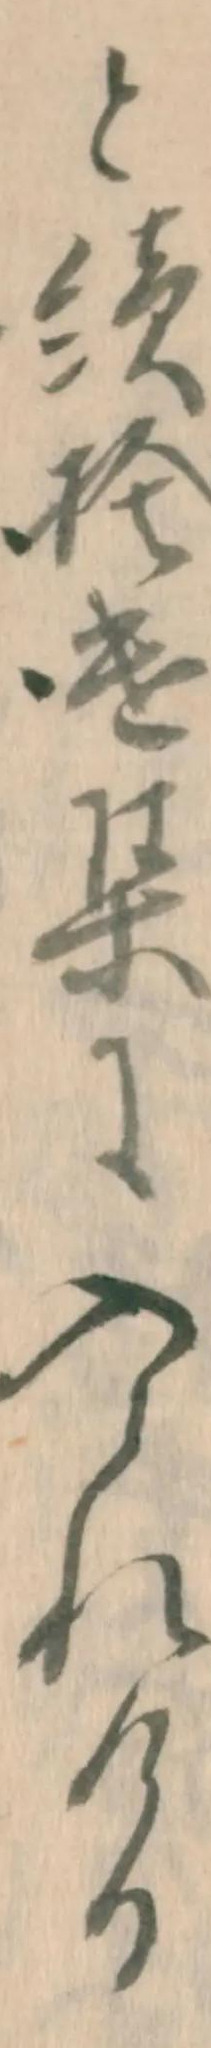と続捨遣集に入られける
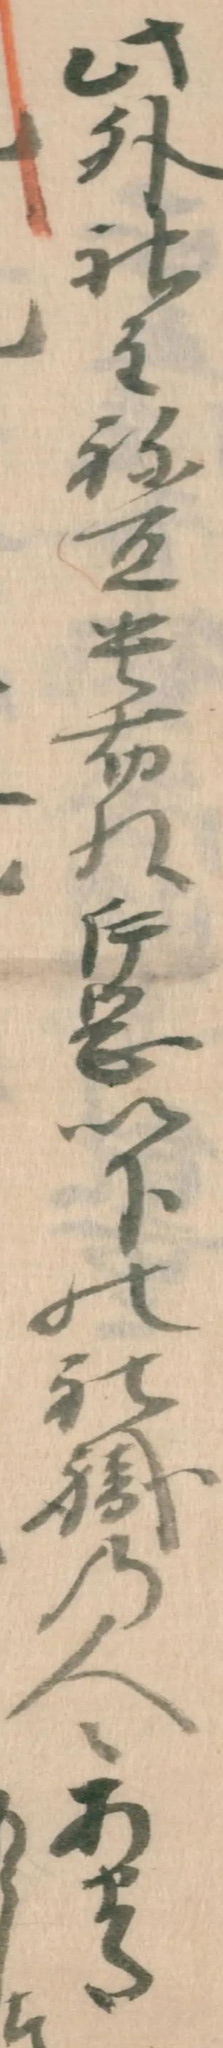此外神主祢宜貴ふね片岡以下の社職の人々あまたもらしつ
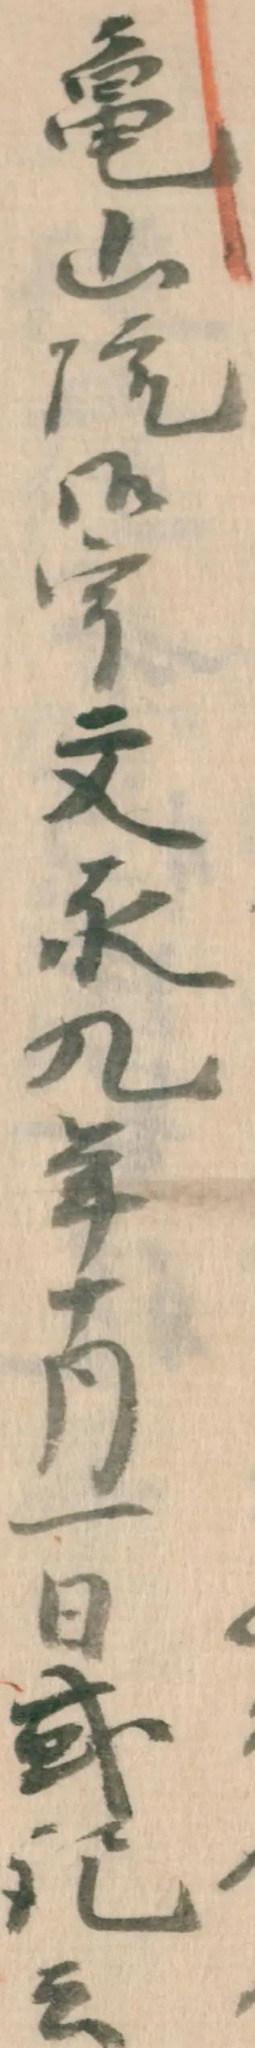亀山院御宇文永九年十月一日或記云

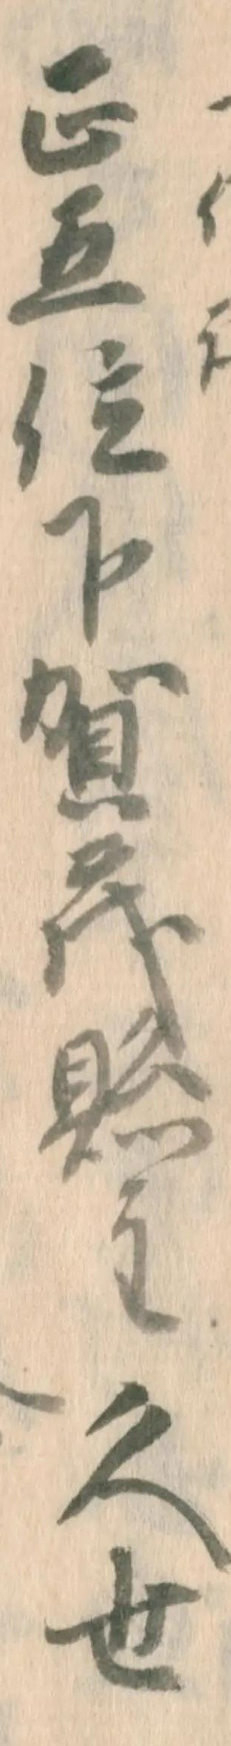正五位下賀茂県主久世
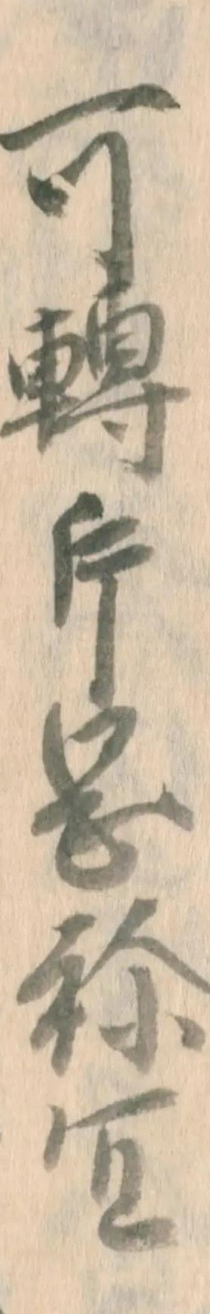可転片岡祢宜
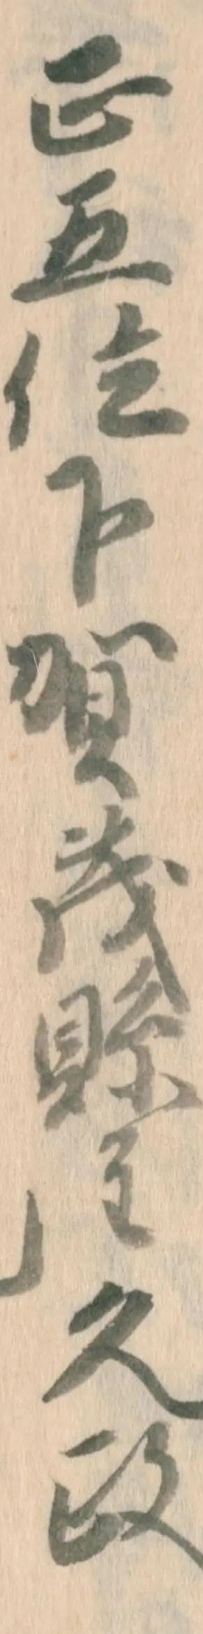正五位下賀茂県主久政
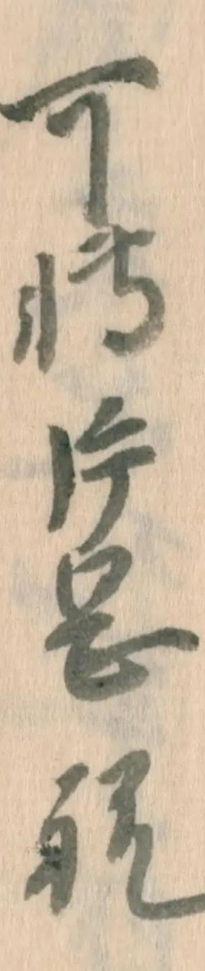可転片岡祝
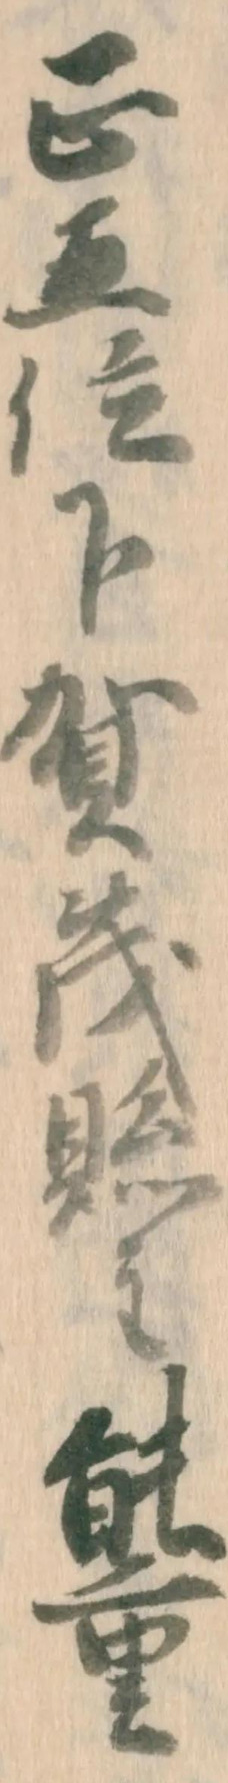正五位下賀茂県主能重
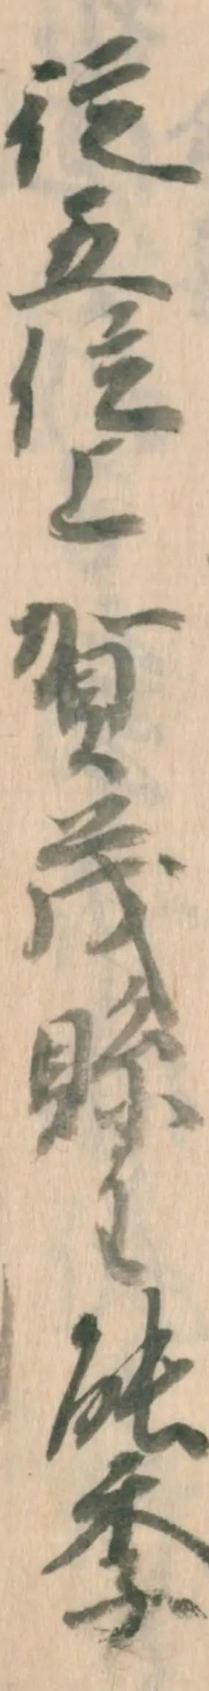従五位上賀茂県主能季
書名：賀茂社記録. 第1冊
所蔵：国立国会図書館 National Diet Library, JAPAN
